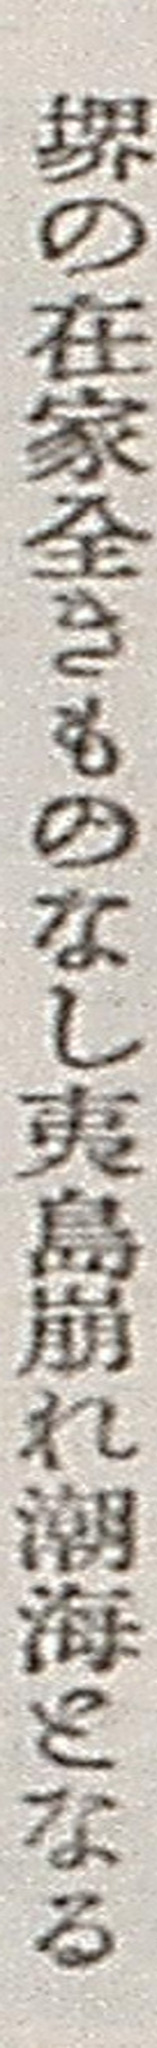和泉堺の在家全きものなし夷島崩れ潮海となる
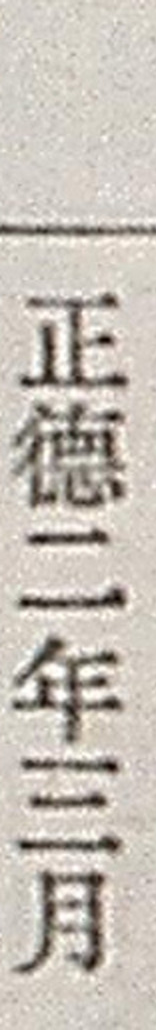正徳二年三月
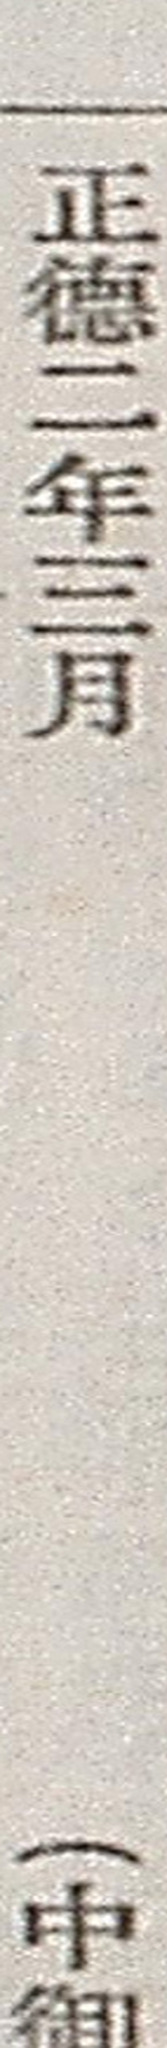正徳二年三月
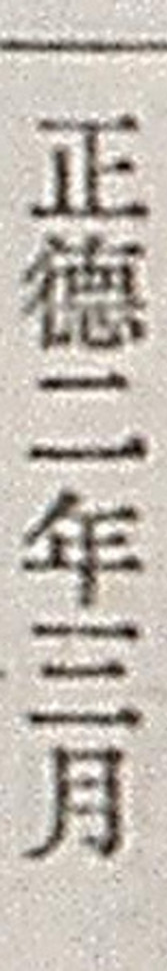正徳二年三月
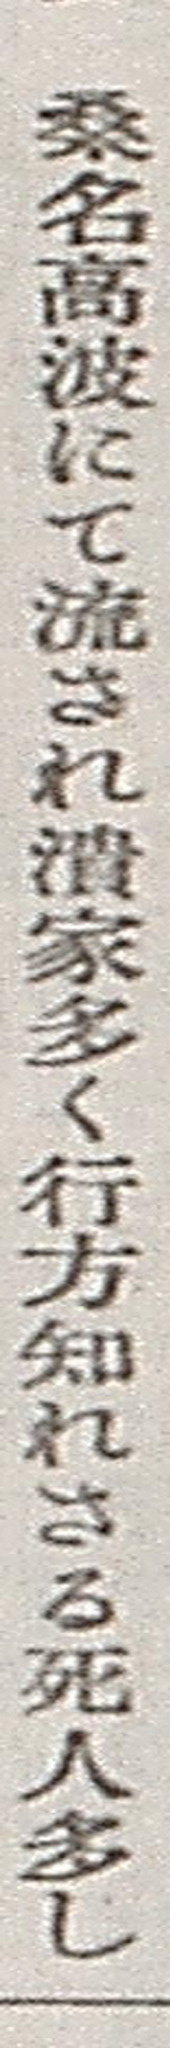伊勢桑名高波にて流され潰家多く行方知れさる死人多し
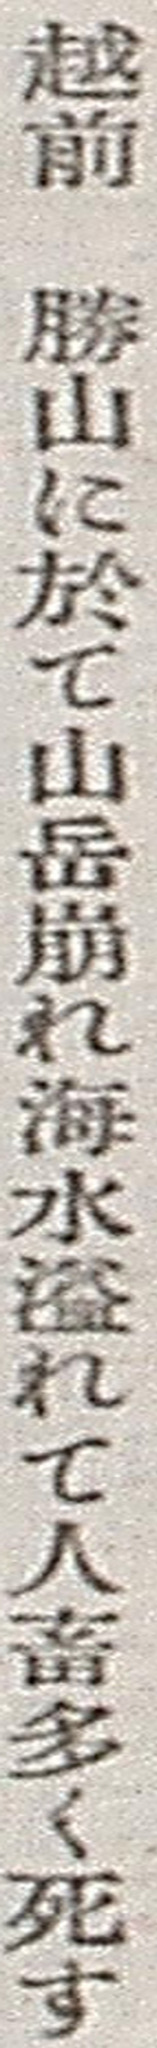越前勝山に於て山岳崩れ海水溢れて人畜多く死す
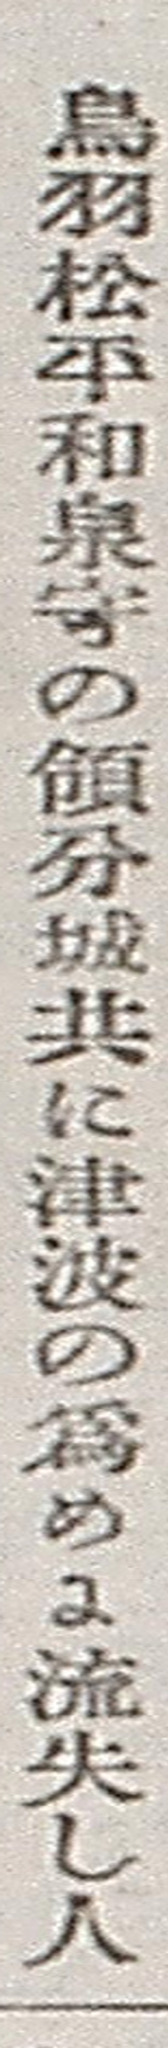志摩鳥羽松平和泉守の領分城共に津波の為めに流失し人
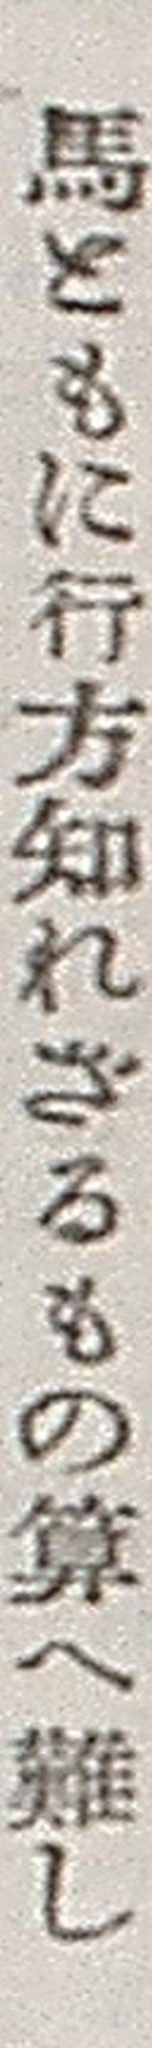馬ともに行方知れさるもの算へ難し
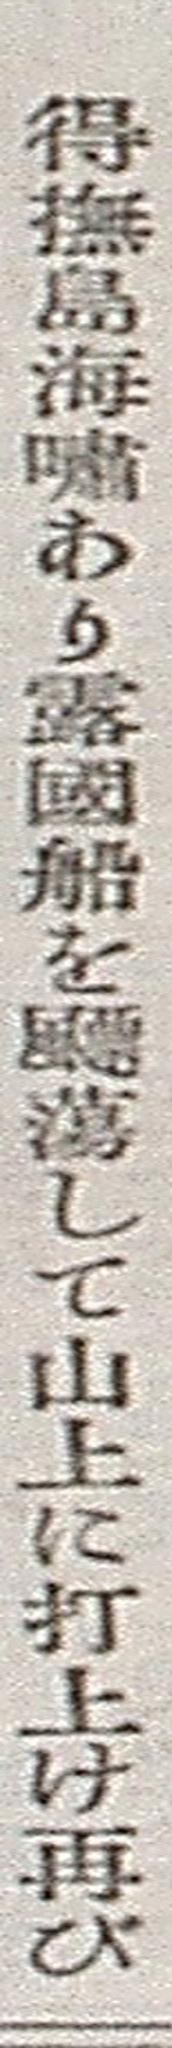得撫島海嘯あり露国船を飃蕩して山上に打上げ再び
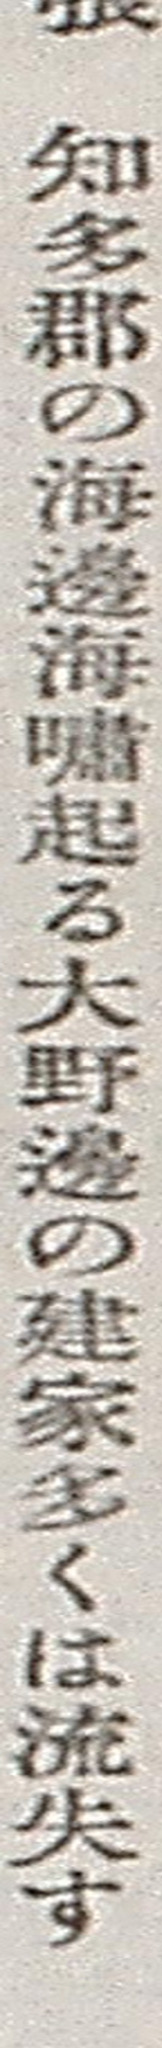尾張知多郡の海辺海嘯起る大野辺の建屋多くは流失す
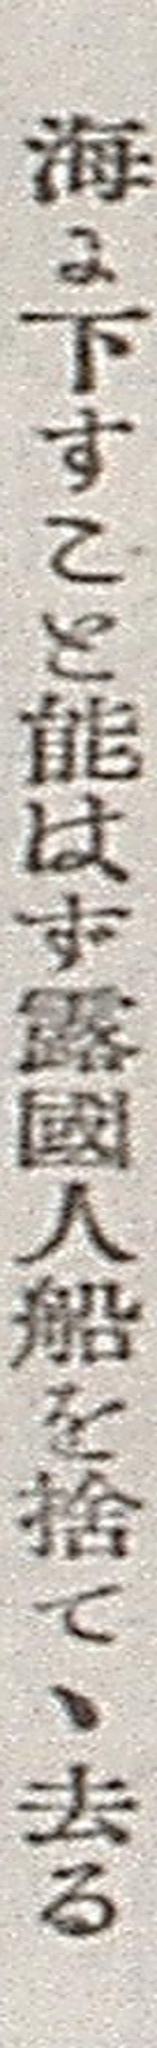海に下すこと能はず露国人船を捨てゝ去る
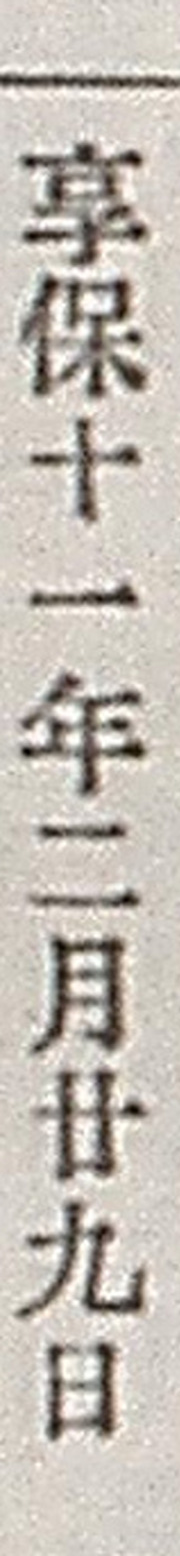享保十一年二月廿九日
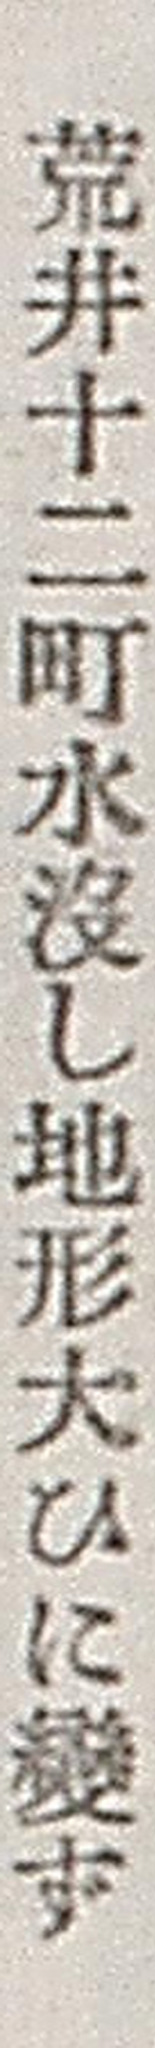遠江荒井十二町水没し地形大ひに変ず
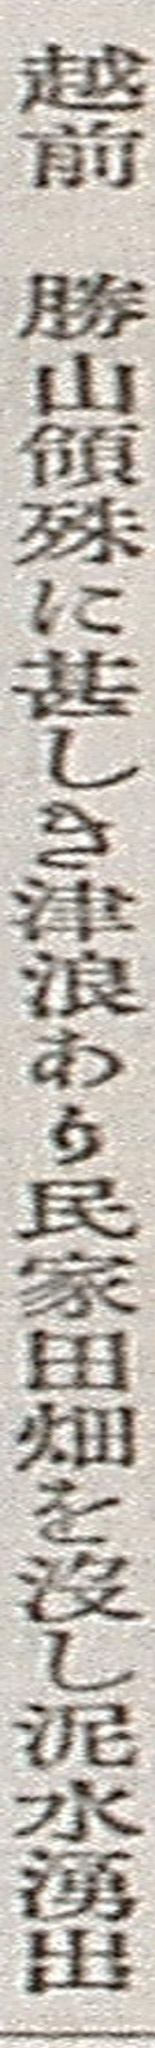越前勝山領殊に甚しき津浪あり民家田畑を没し泥水湧出
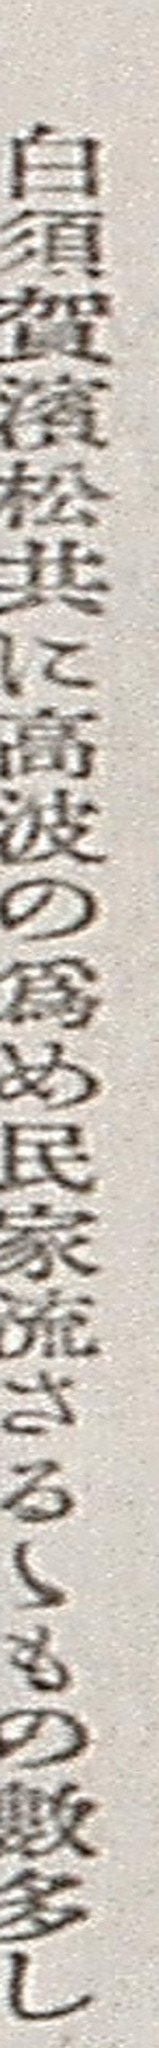白須賀浜松共に高波の為め民家流さるゝもの数多し
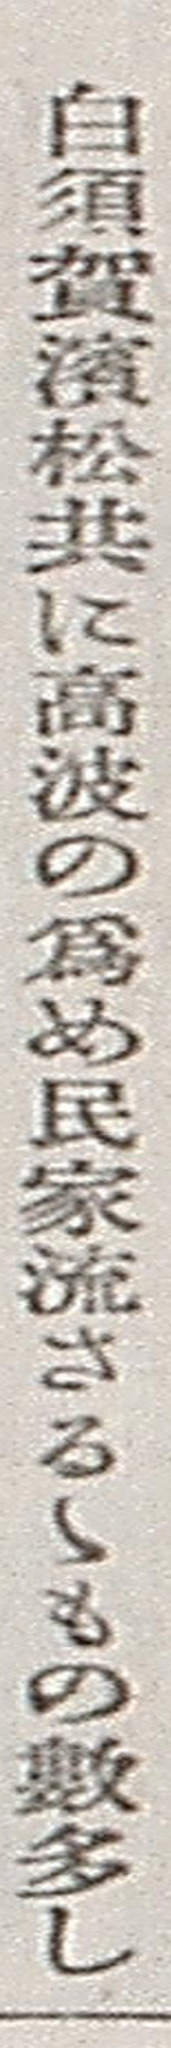白須賀浜松共に高波の為め民家流さるゝもの数多し
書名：風俗畫報臨時増刊第百二十號　大海嘯被害録（下）
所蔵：東京大学地震研究所図書室 Earthquake Research Institute Library, The University of Tokyo, JAPAN
